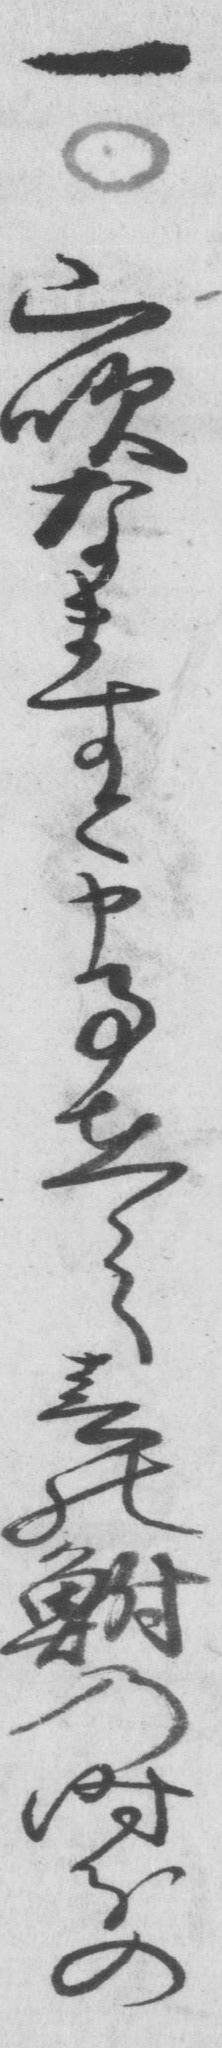一○山吹なますと申事在之春の鮒の時分の
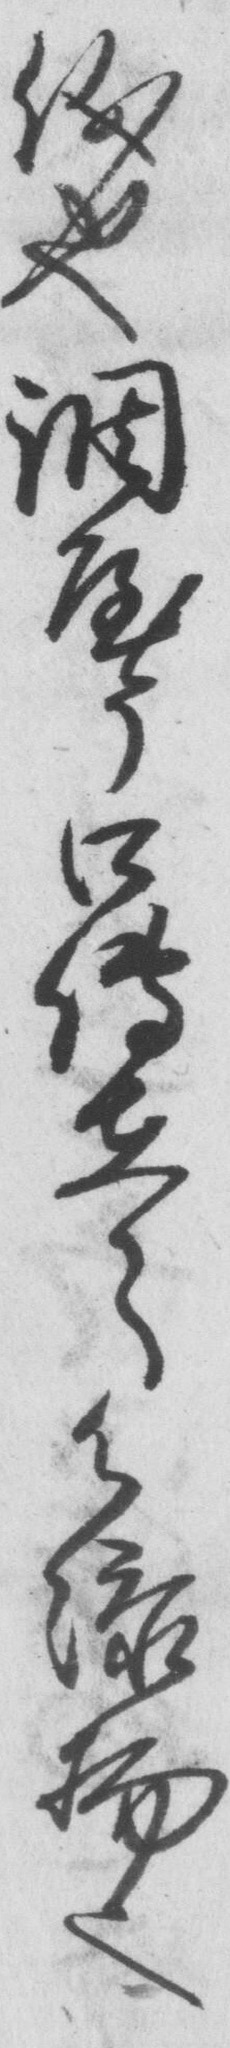儀也調やう口伝在之御添物也
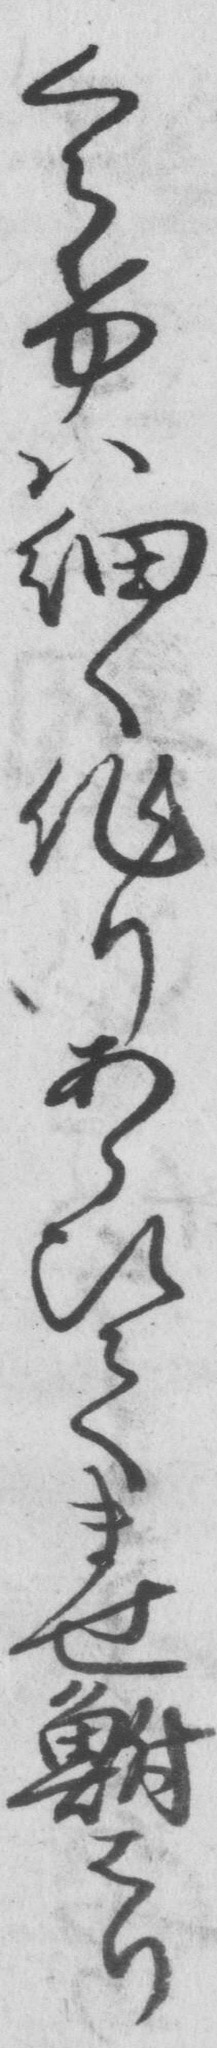一○くらけは細く作りあらひてませ鮒はり
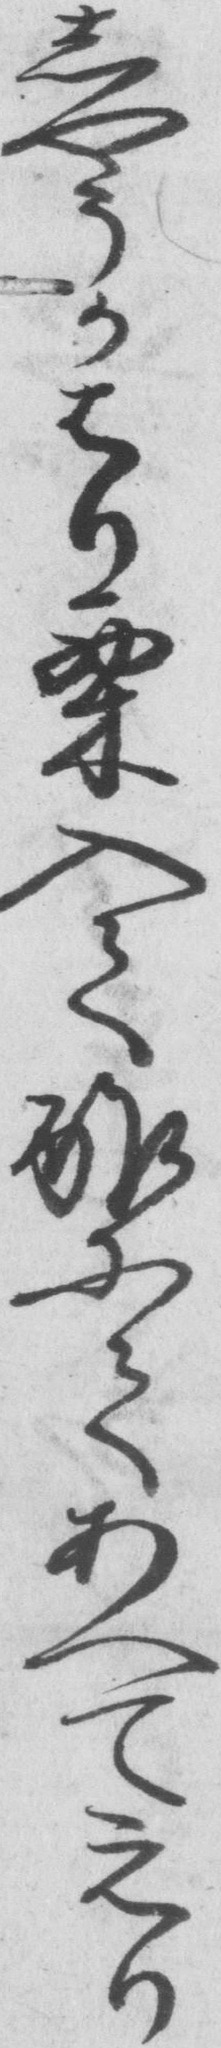しやうかはり栗入て酢にてあへてえり
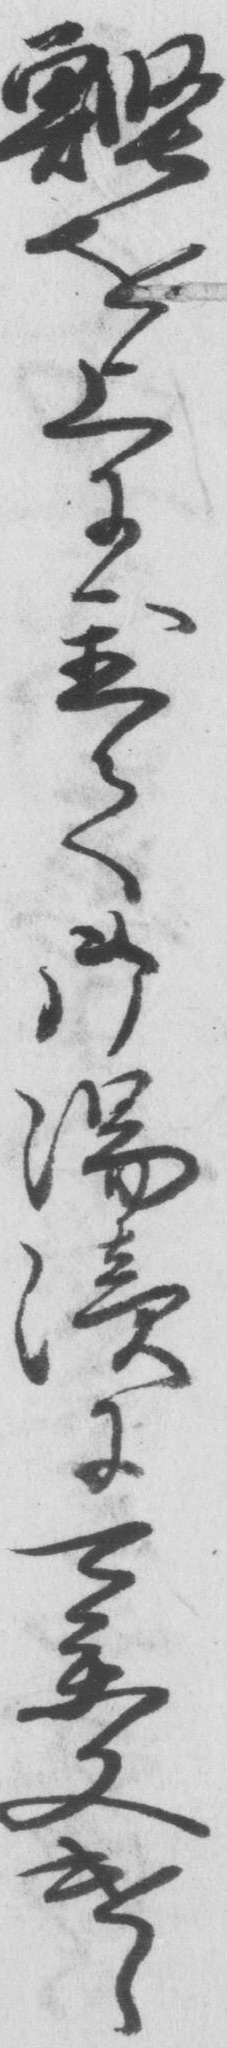鰹を上に置て御湯漬に可参又遣し
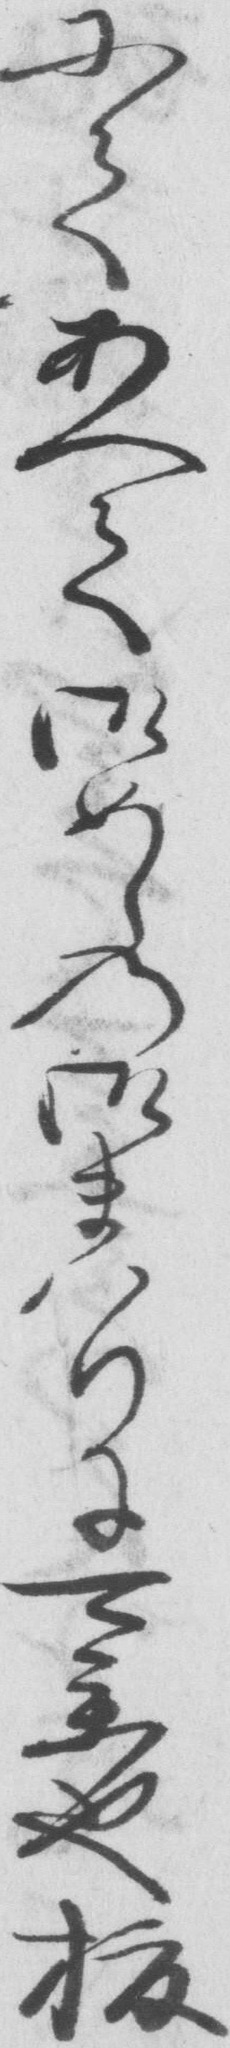にてあへて御めしの御まはりに可参也榎
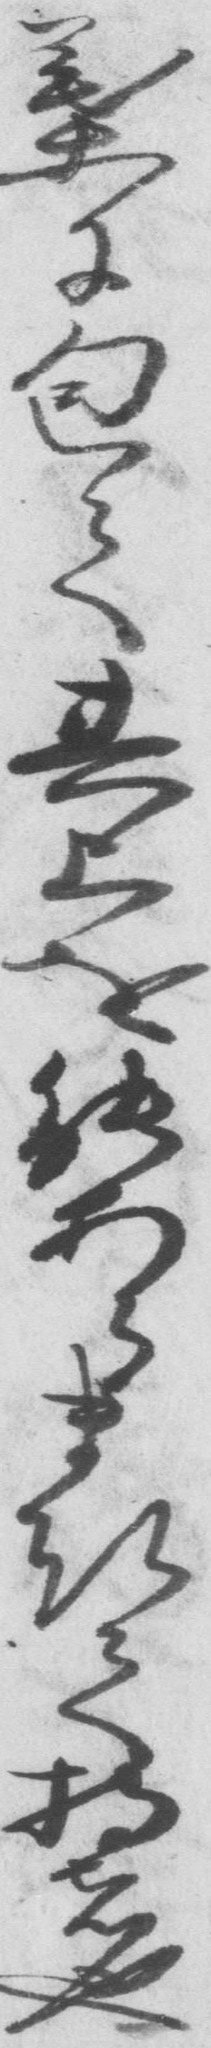葉に包て其上を能あらまきて持者也
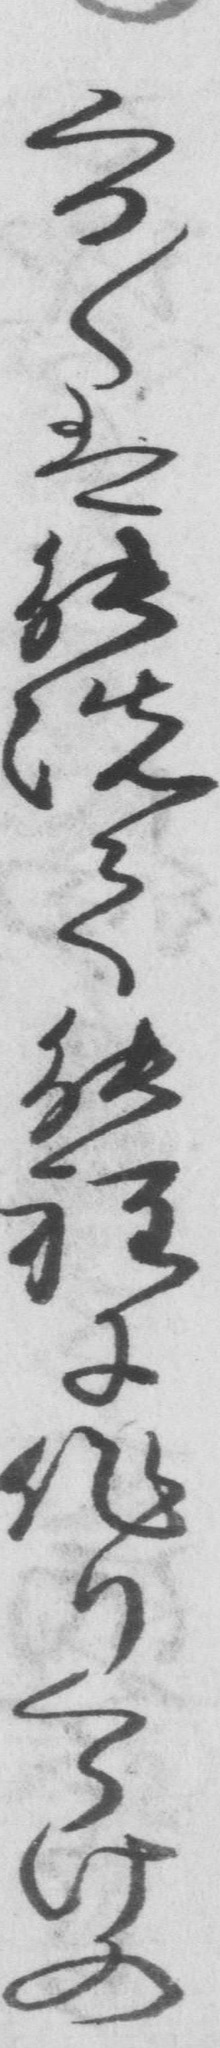一○くる〳〵は能洗て能程に作りくらけの
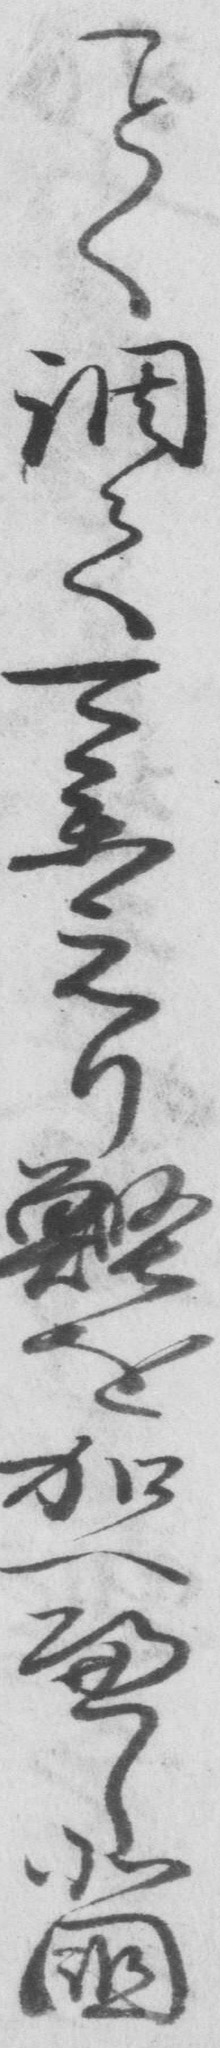ことく調て可参えり鰹を加へへし北国
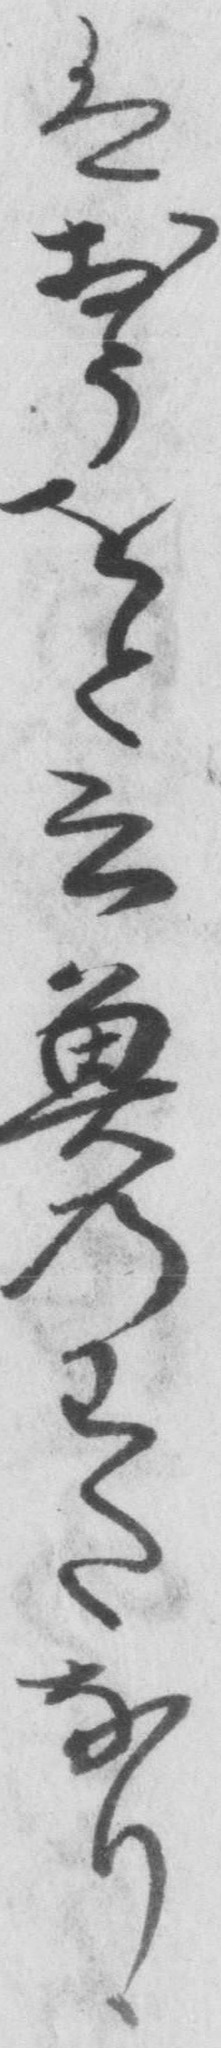はおうをと云魚のわたなり
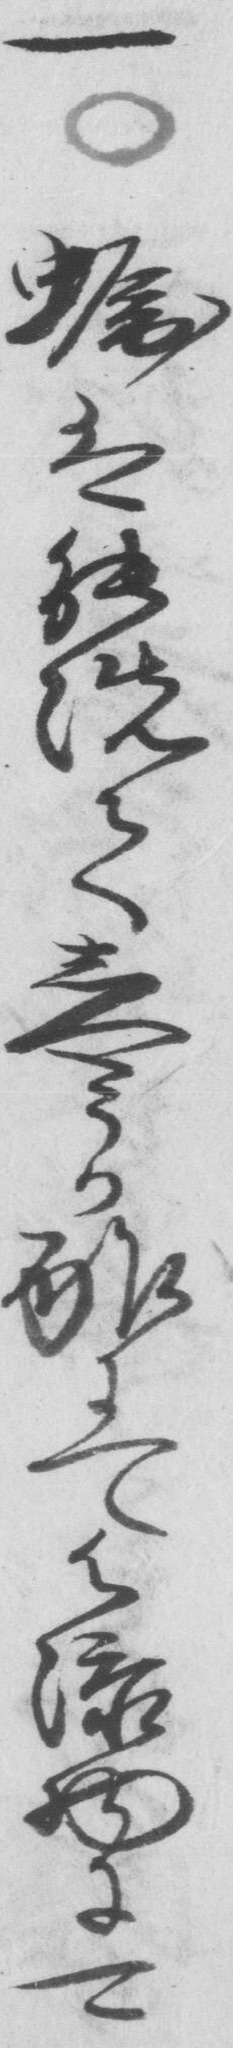一○蠣は能洗てしやみか酢にて御添物に可
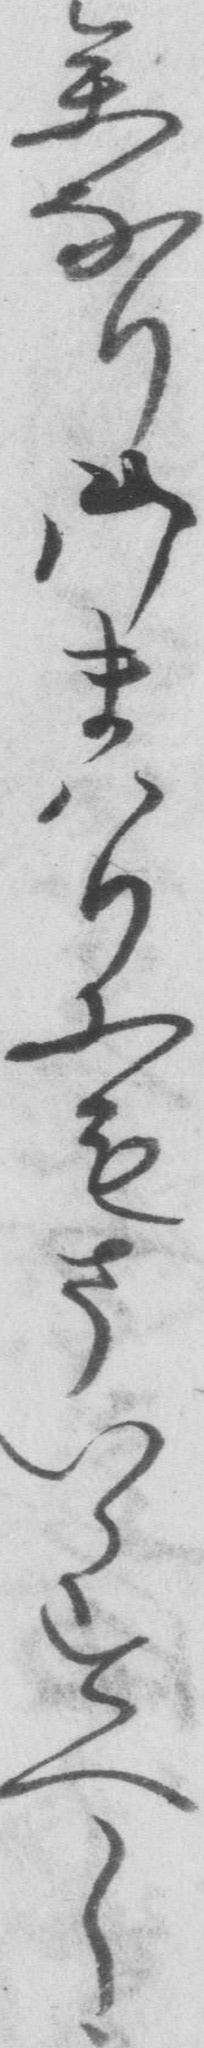参なり御まはりにもまいらすへし
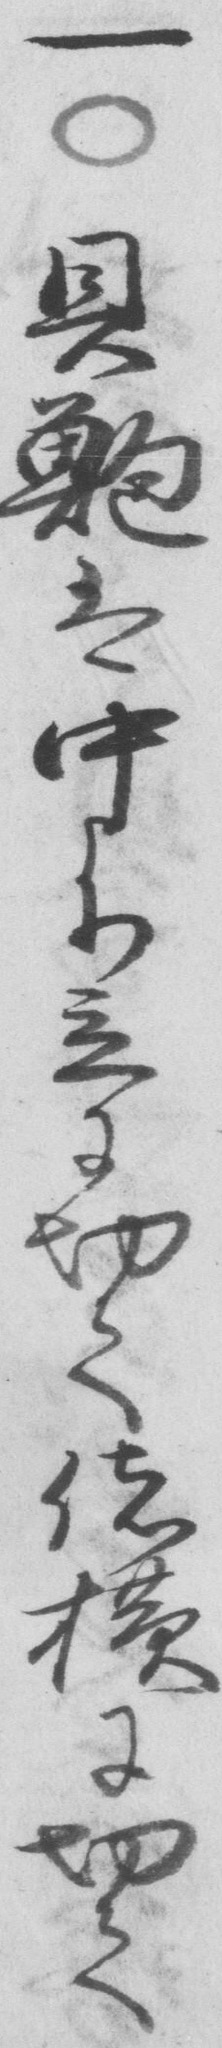一○貝鮑は中より立に切て偖横に切て
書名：料理次第
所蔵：大阪府立大学学術情報センター 国文学研究資料館
